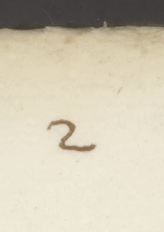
2
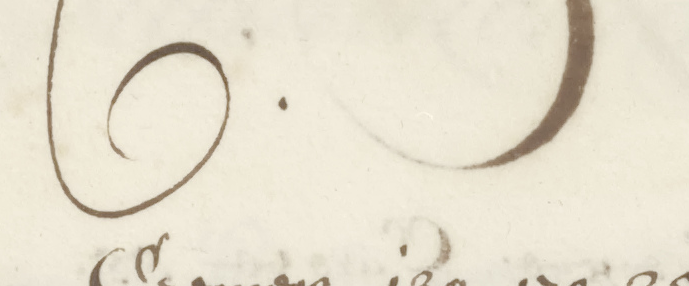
C.
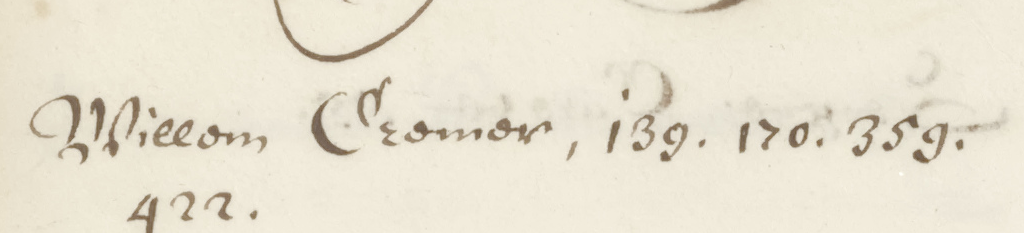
Willem Cremer, 139, 170, 359,
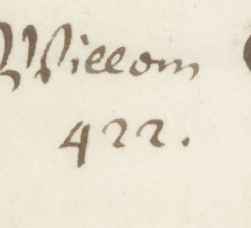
422.
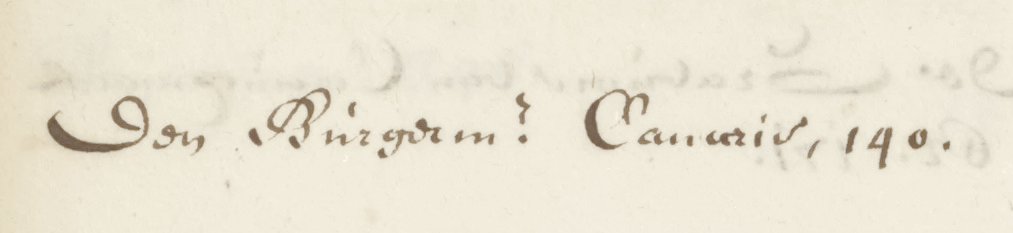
Den Burgermr. Canaris, 140.
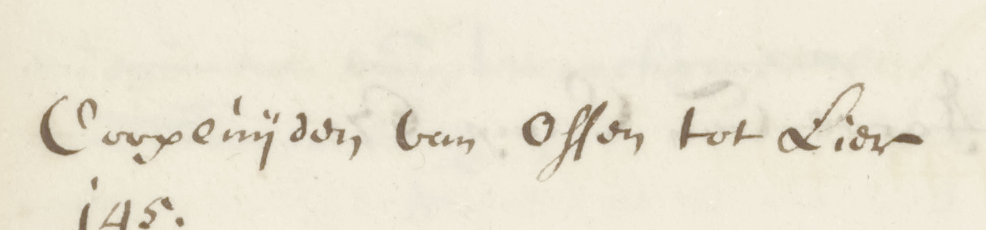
Coopluijden van Ossen tot Lier
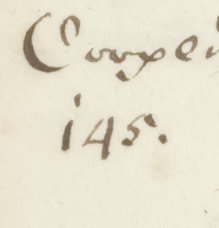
145.
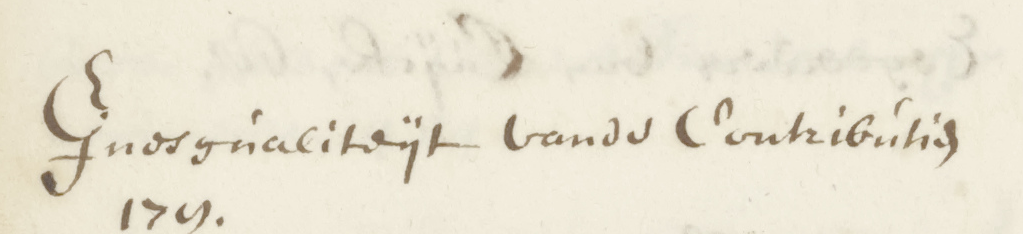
Inesqualiteijt vande Contributien
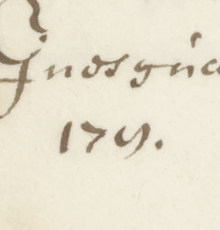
178.
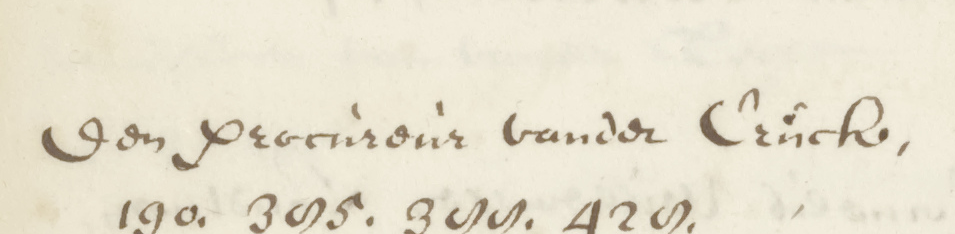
Den procureur vander Cruck,
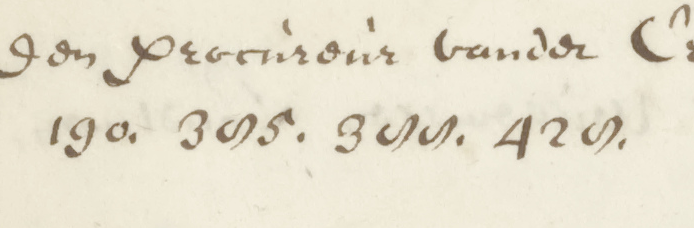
190, 385, 388, 428.
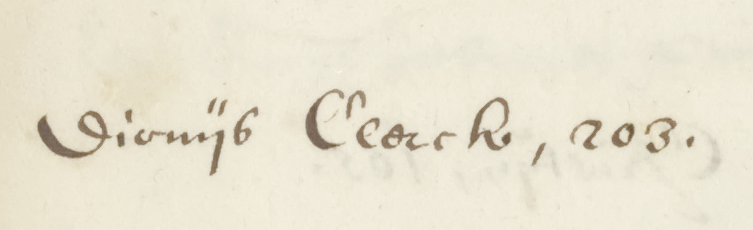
Dionijs Clerck, 203.
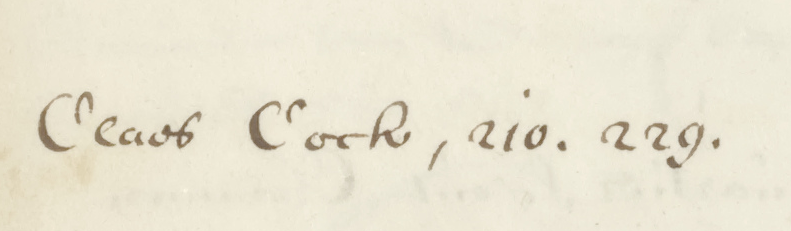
Claes Cock, 210, 229.
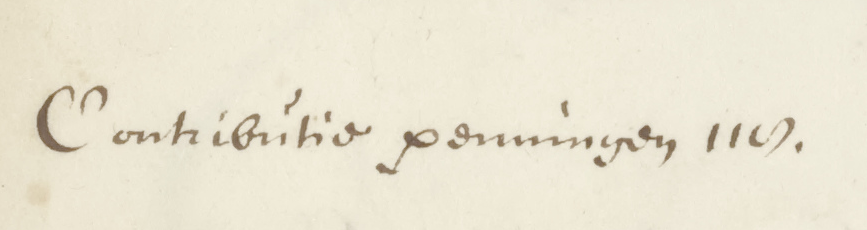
Contributie penningen 118.
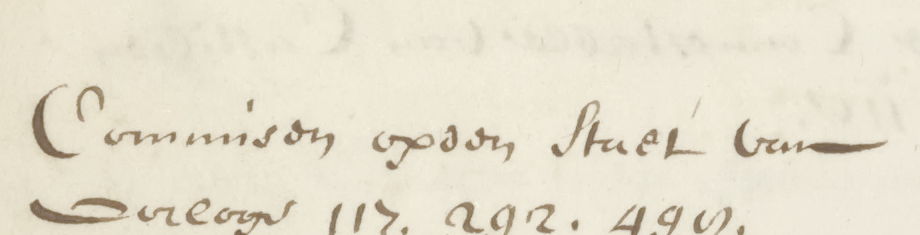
Commisen opden Staet van
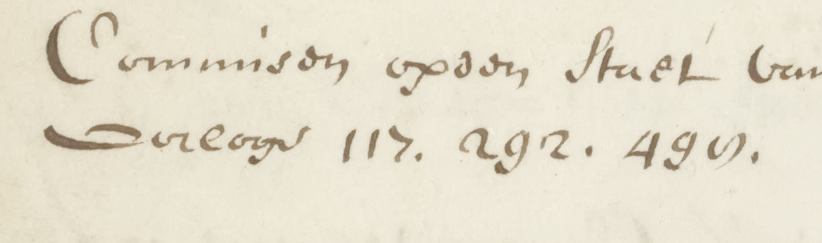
Oorloge 117, 292, 498.
